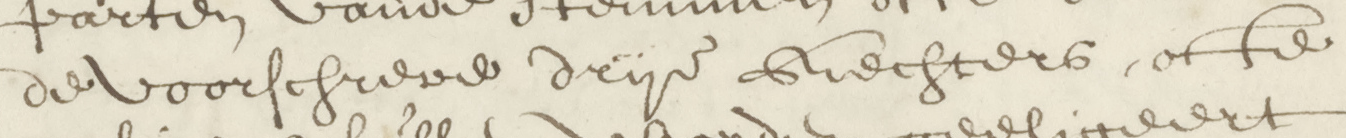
de voorschreve drije Rechters, ofte
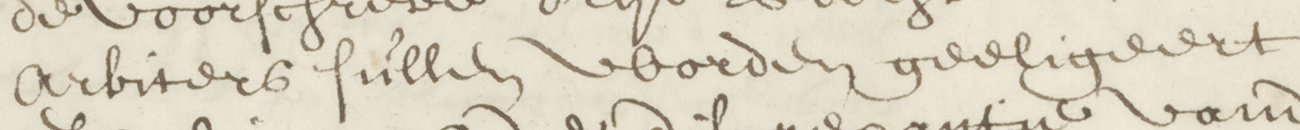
Arbiters sullen worden geeligeert;
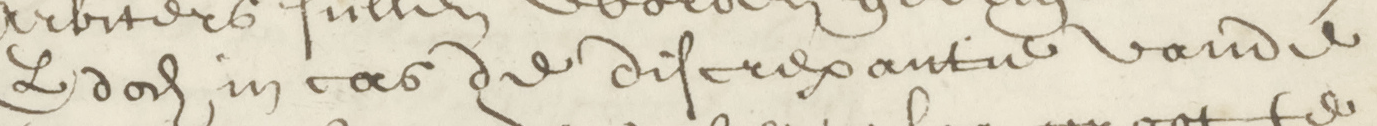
Edoch in cas de discrepantie vande
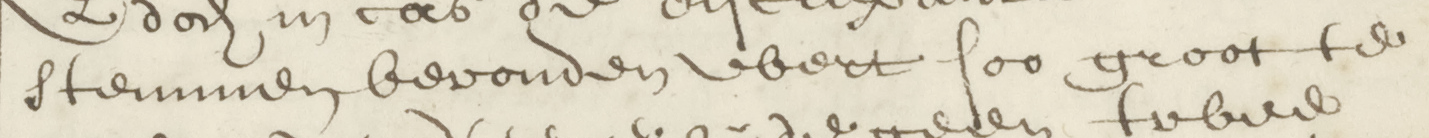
Stemmen bevonden wert soo groot te
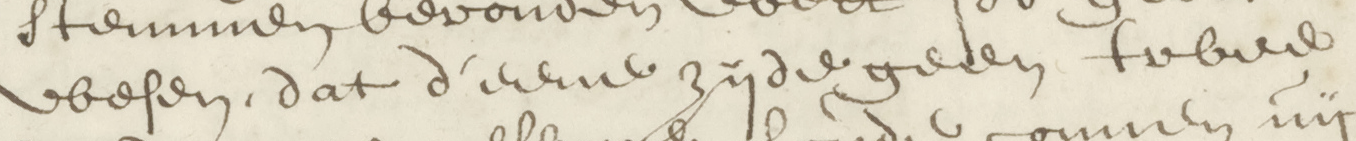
wesen, dat d‛eene zijde geen twee
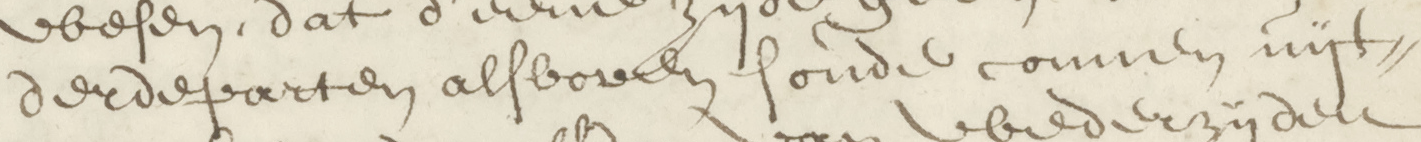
derdeparten als boven soude connen uijt„
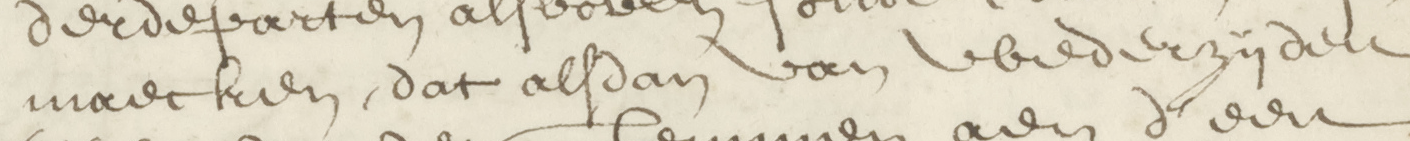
maecken, dat alsdan van wederzijden
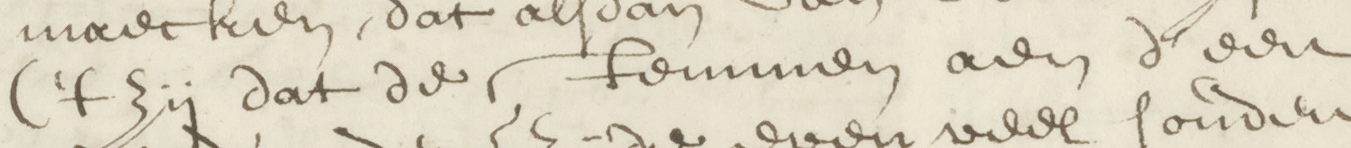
(‛t zij dat de stemmen aen d‛een
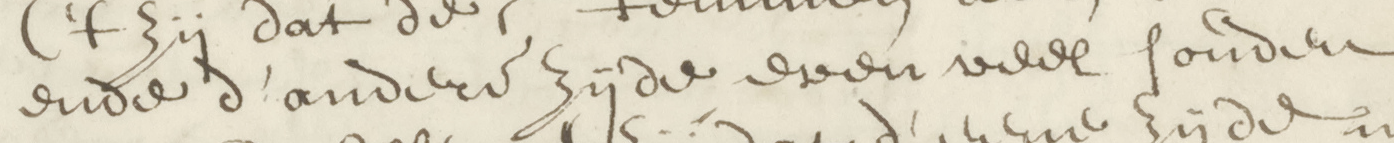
ende d‛andere zijde even veel souden
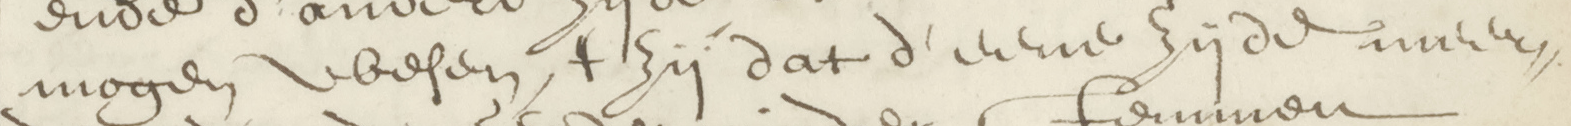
mogen wesen, t zij dat d‛eene zijde meer„
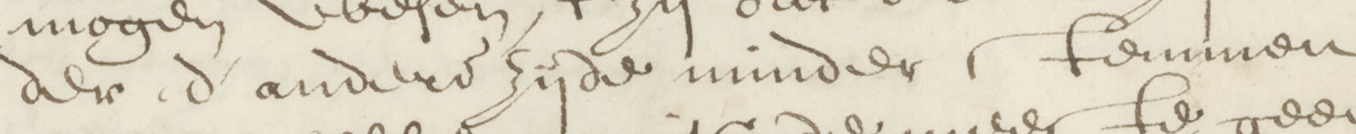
der, d‛andere zijde minder stemmen
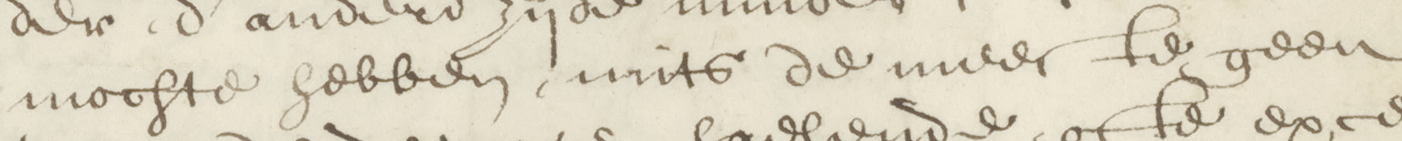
mochte hebben, mits de meeste geen
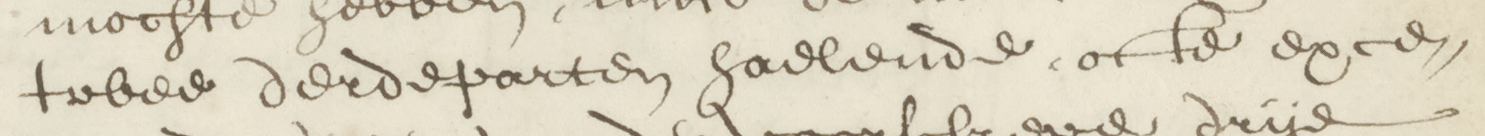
twee derdeparten haelende, ofte exce„
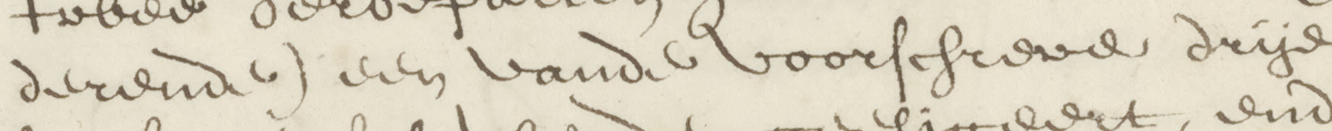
derende) een vande voorschreve drije
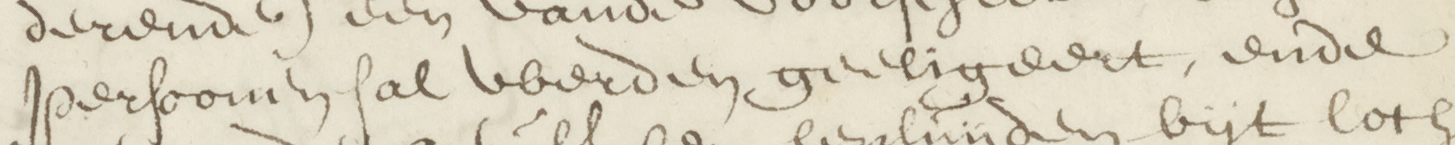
Persoonen sal werden geeligeert, ende
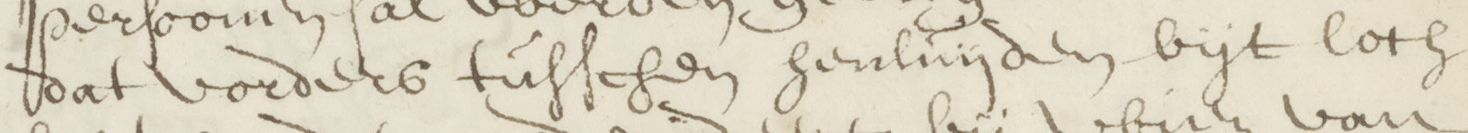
dat vorders tusschen henluijden bijt loth
